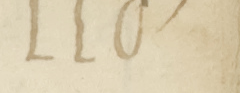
118
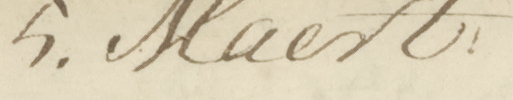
5. Maert.
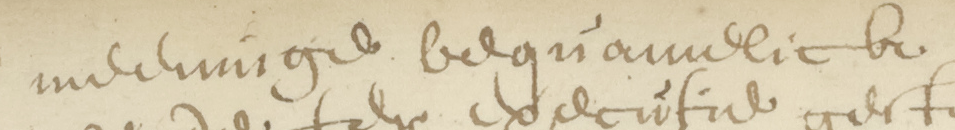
meeninge bequamelick
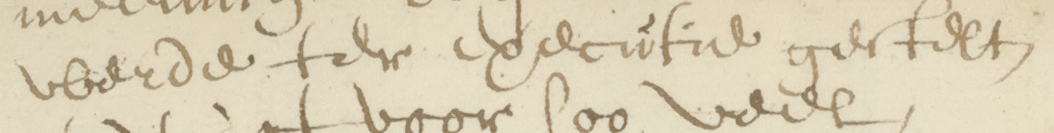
werde ter executie gestelt,
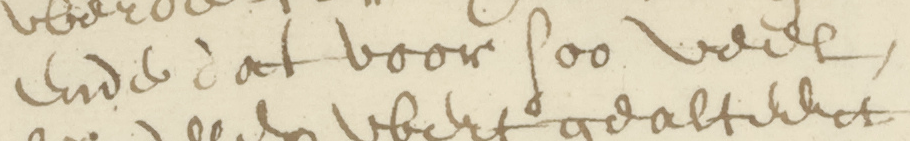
ende dat voor soo veel
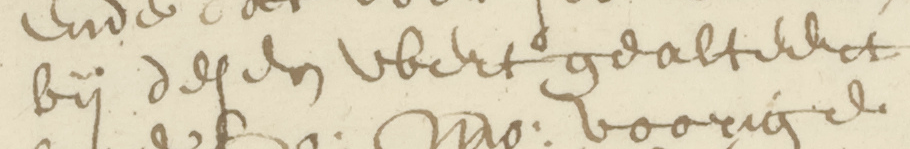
bij desen wert gealteert
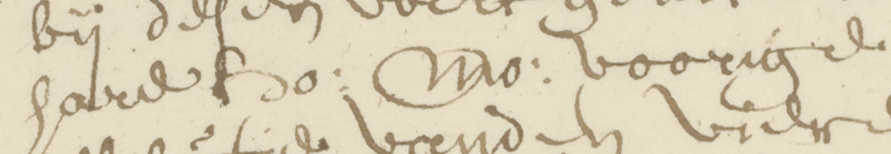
hare Ho:Mo: voorige
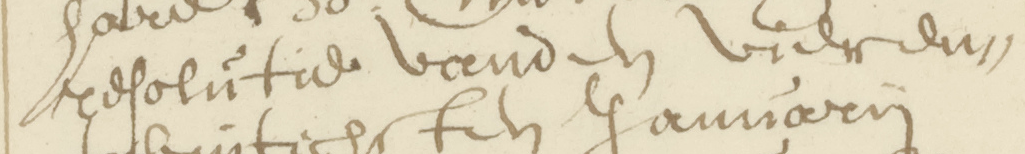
resolutie vanden vieren„
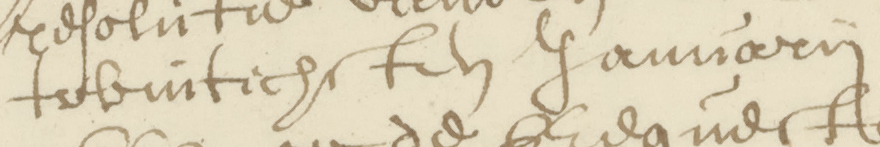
twintichsten Januarij
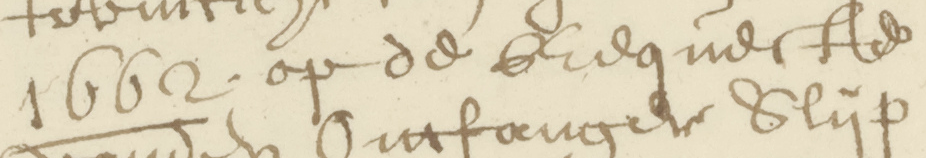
1662 op de Requeste
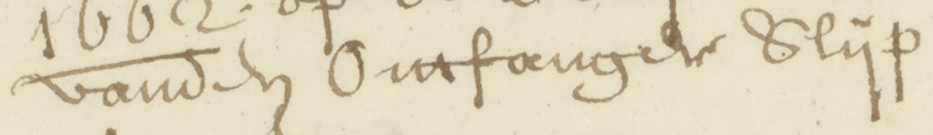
vanden Ontfanger Slijp
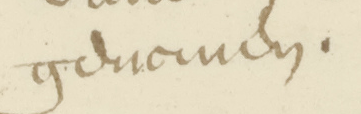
genomen.
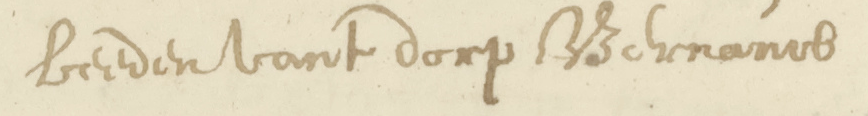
Beeden vant dorp Bernauw
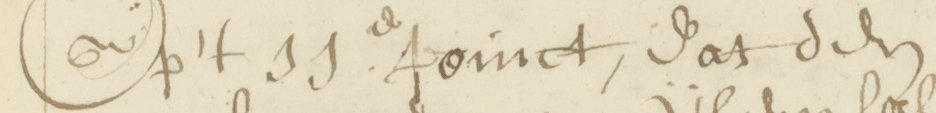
Opt 11e poinct, dat den
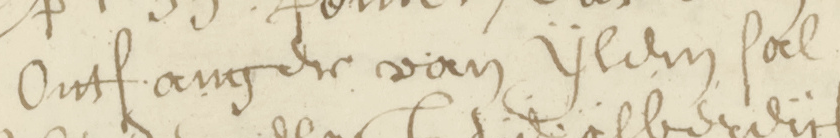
Ontfanger van Ylem sal
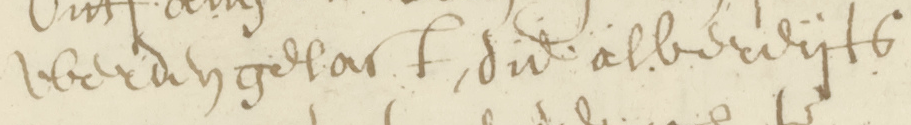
werden gelast, die albereijts
